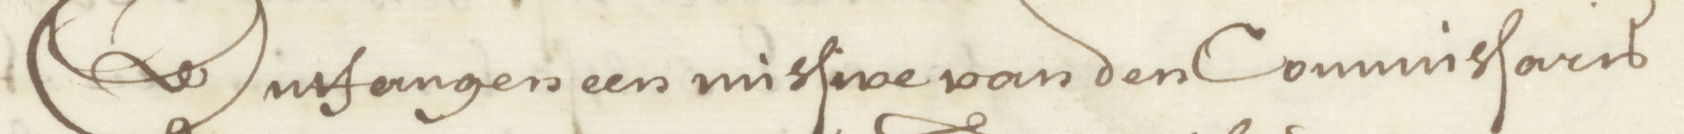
Ontfangen een missive van den Commissaris
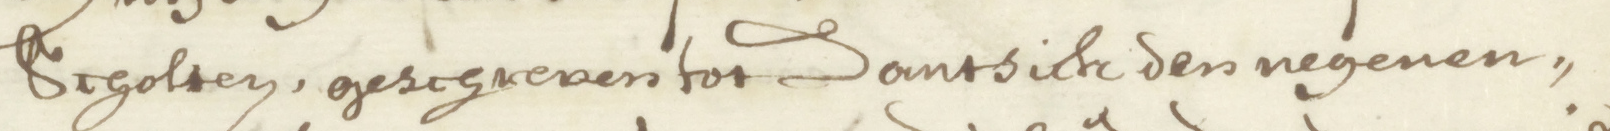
Scholten, geschreven tot Dantsich den negenen„
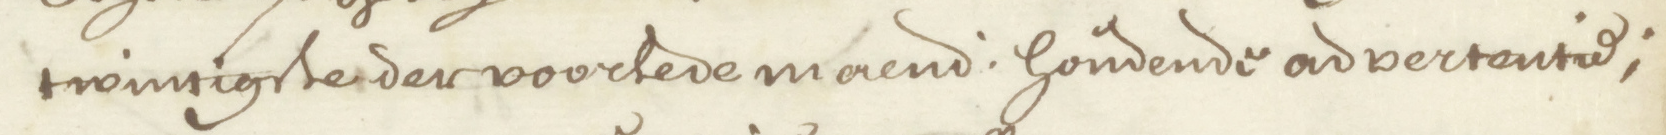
twintigste der voorlede maend: houdende advertantie:
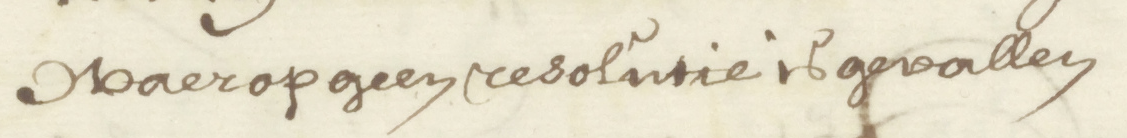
Waerop geen resolutie is gevallen
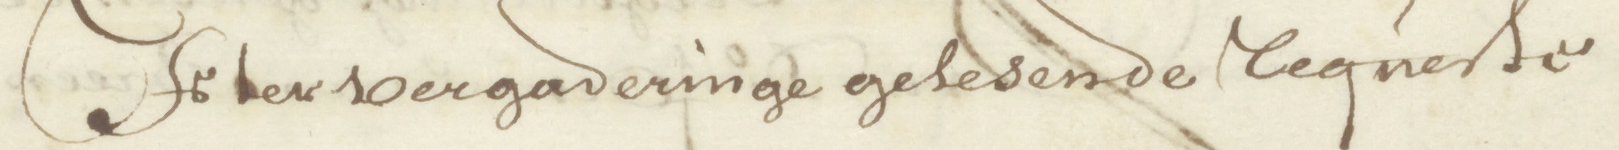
Is ter vergaderinge gelesende requeste
